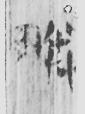朕
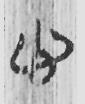心
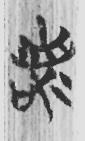若
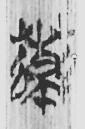藥
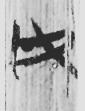女
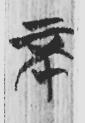不
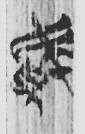{民見}
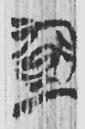{土旬}
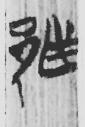{戉阝}
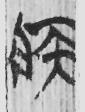疾
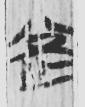罔
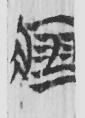瘳
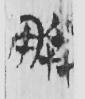朕
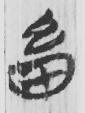畜
